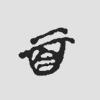百
